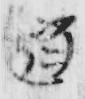既
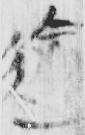達
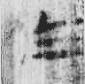於
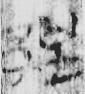郢
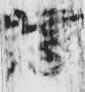𨟻（將）
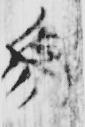須
